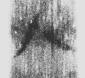八
